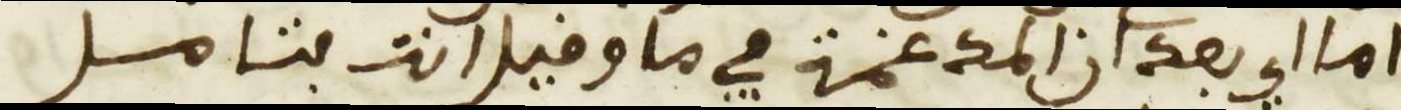اما أي بعد ان المدغمة في ما وقيل انت فتامل
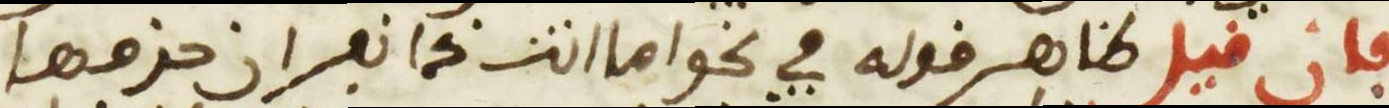فان قيل ظاهر قوله في نحو اما انتا ذا نفران حذفها
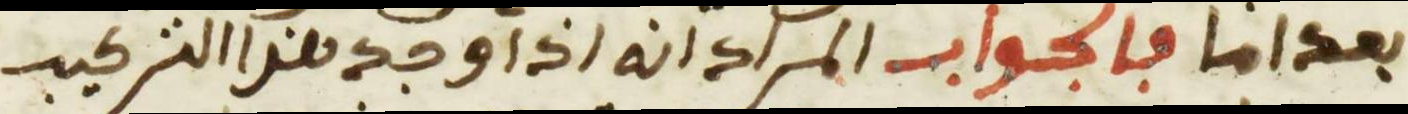بعد اما فالجواب المراد انه اذ وجد هذا التركيب
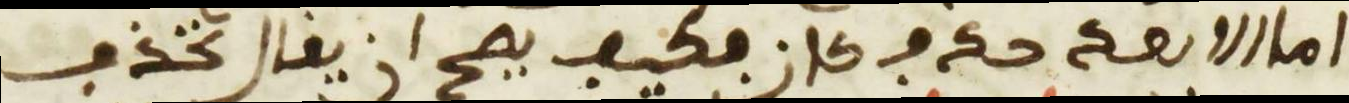اما الا بعد حذف كان فكيف يصح ان يقال تحذف
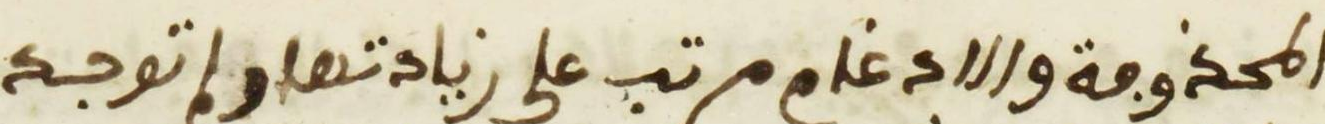المحذوفة والادغام مرتب على زيادتها ولم توجد
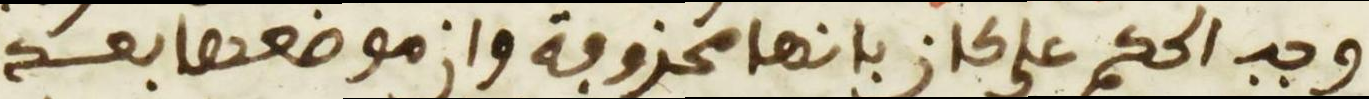وجب الحكم على كان بانها محذوفة وان موضعها بعد
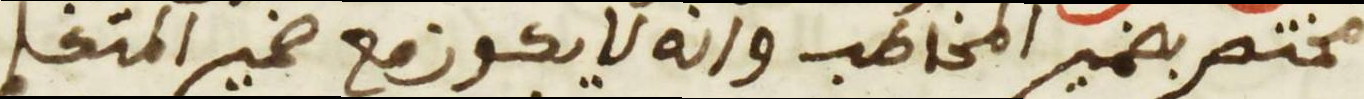مختصر بضمير المخاطب وانه لا يكون مع ضمير المتكلم
